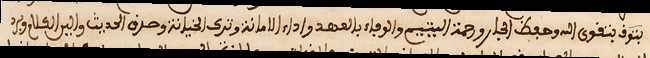بتوق بتقوى الله وحفظ الجار ورحمة اليتيم والوفاء بالعهد واداء الامانة وترك الخيانة وصرق الحديث والين الكلام وبرد
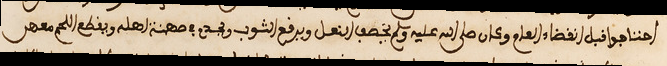احتاجوا قبل انقضاء العام وكان صلى الله عليه وسلم يخصف النعل ويرفع الثوب ويحدم في صهنة اهله ويقطع اللحم معهن
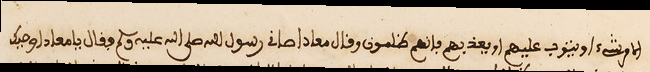الامر شىء او يتوب عليهم او يعذبهم فانهم ظلمون وقال معادا صانى رسول الله صلى الله عليه وسلم فقال يا معادا وحيك
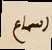رسماع
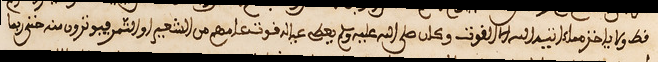قط ولا ياخذ مماء اتيه الله الا القوت وكان صلى الله عليه وسلم يعطى عياله قوتما مهم من الشعير او التمر فيوترون منه حتى ربما
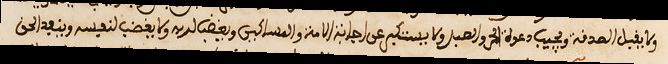ولا يقبل الصدقة ؤيجيب دعوة الحمر والصبد ولا يستكبر عن اجابة الامة والساكين ويغقب له به ولايغضب لنفسه وينفد الحق
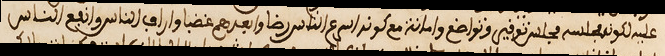عليه لكونه مجلسه مجلس توقير وتواضع وامانة مع كونه اسرع الناس رضا وابعدهم غضبا واراف الناس وانفع الناس
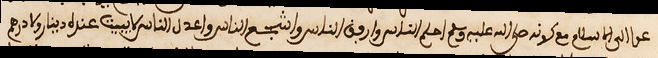عوا الى الاسلام مع كونه صلى الله عليه وسلم احلم الناس وارفق الناس واشجع الناس واعدل الناس لا يبيت عنده دينار ولادرهم
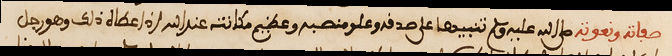صفاته ونعوته صلى الله عليه وسلم تنبيها على صدقه وعلو منصبه وعظيم مكانته عند الله اذا عطاه ذلك وهو رجل
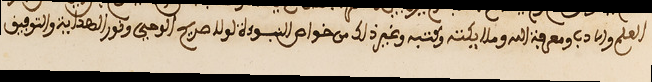العلم والادب ومعرفة الله وما ايكته وكتبه وغير ذلك من خواص النبوءة لو لا صريح الوحي ونور الهداية والتوفيق
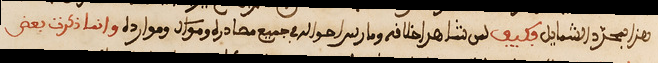هذا بحمد الشمايل فكيف لمن شاهدا خلاقه ومارس احوا له في جميع مصادره ومواد وموارده وانما ذكرت بعض
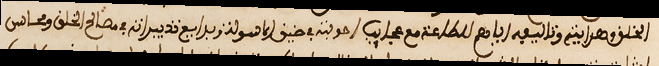الخلق وهدايته وتاليفه اياهم للطاعة مع عجايب حوبته في ضيق الاسولة وبدايع تدبيراته في مصالح الخلق ومحاسن
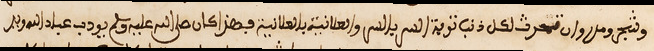وشجر ومدروان تحرث لكل ذنب توبة السر بالسر والعلانية فهذا كان صلى الله عليه وسلم يودب عباد الله ويد
